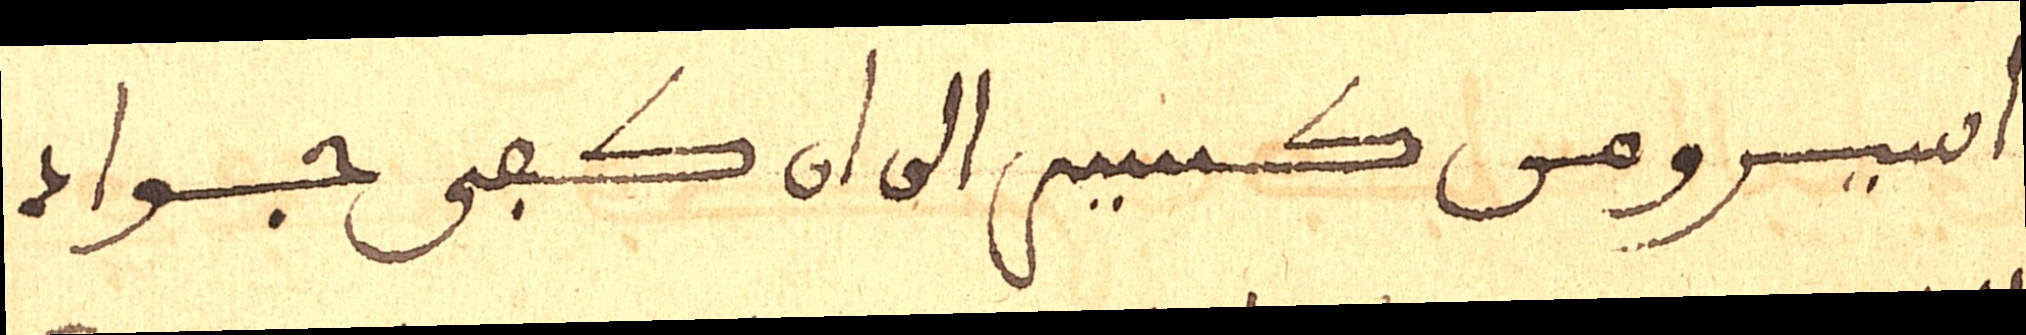اسير ومن كسير الى ان كفى جواد
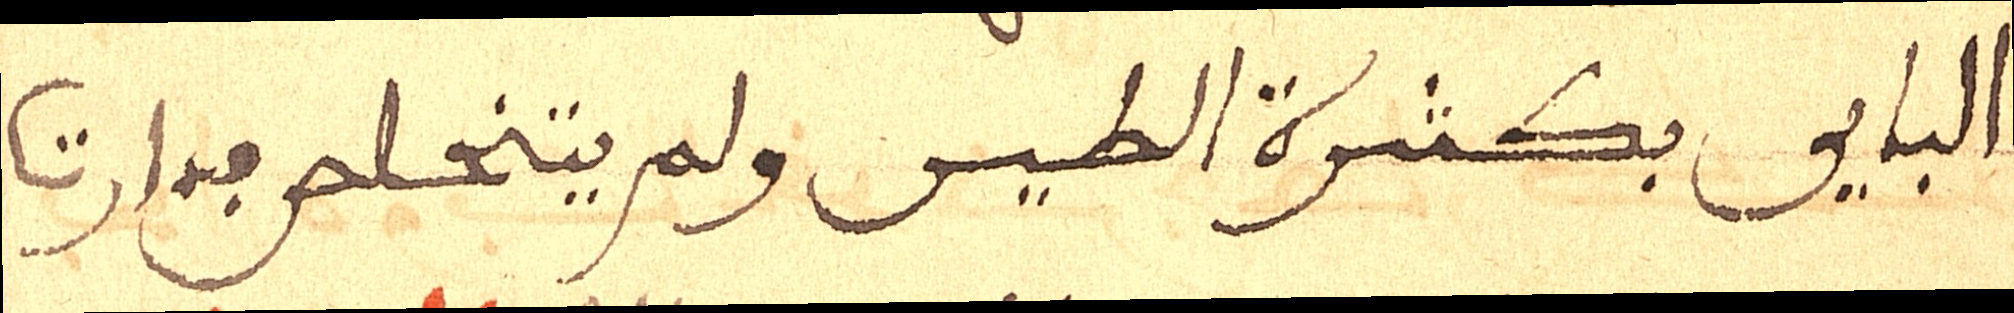الباي بكثرة الطين ولم يتخلص فدارت
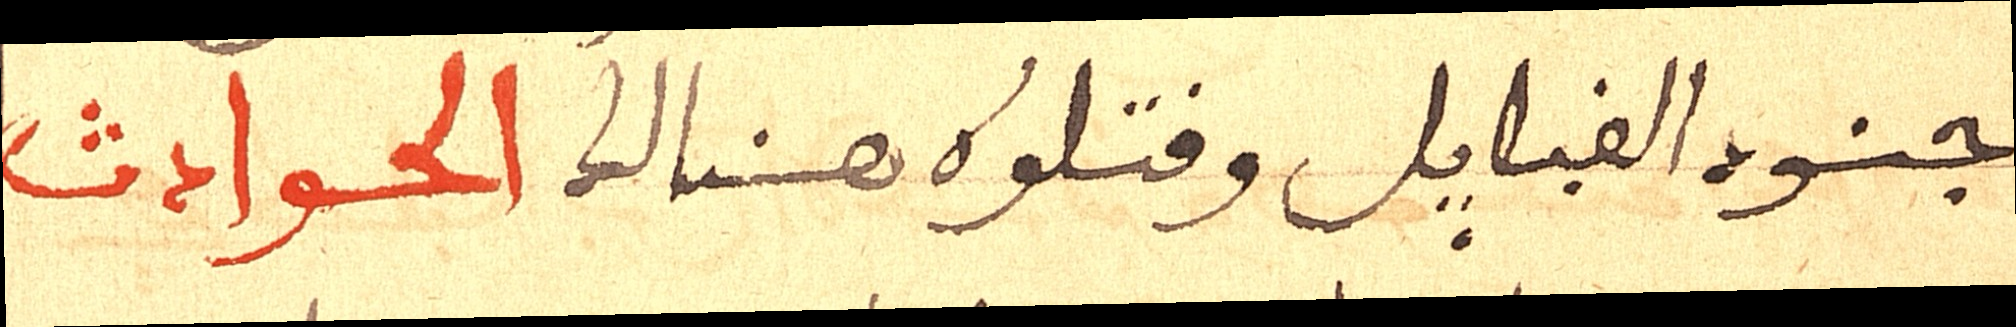جنود القبائل وقتلوه هنالك الحوادث
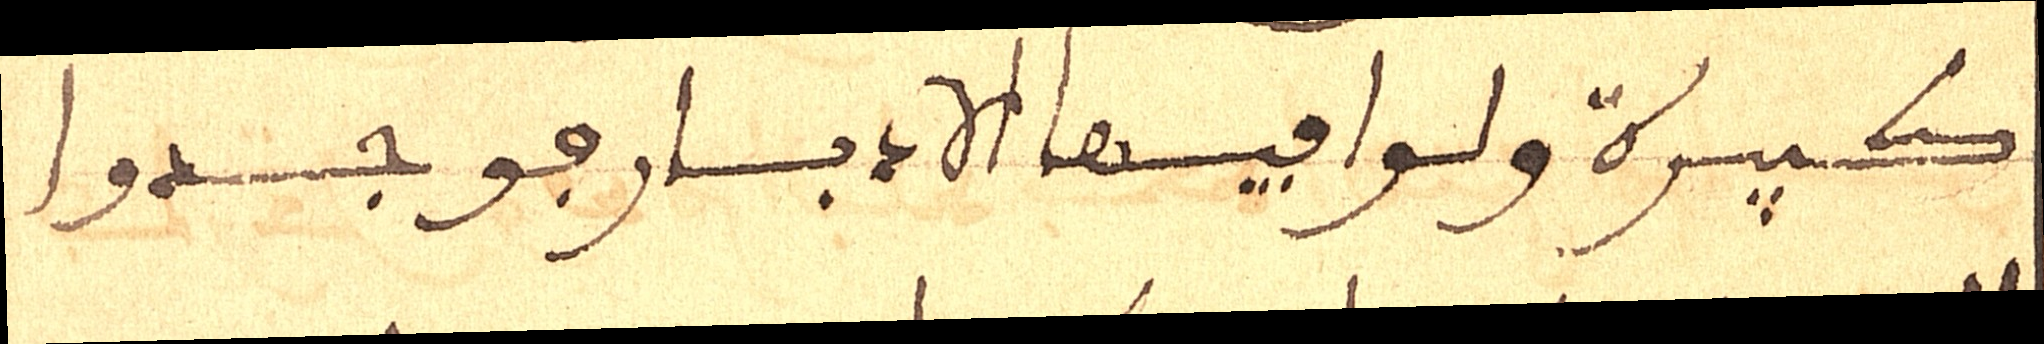كبيرة ولوا فيها الادبار فوجدوا
